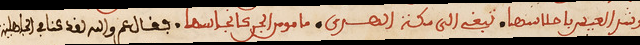وشد العيس باحلاسها تبغى الى مكة الهدى ما مومن الجن كالجاسها فقال عمر والله لقد كنا في الجاهلية
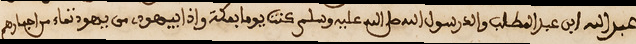عبد الله ابن عبد المطلب والد رسول الله صلى الله عليه وسلم كنت يوما بمكة واذا بيهودى من يهود تماء من اجباره
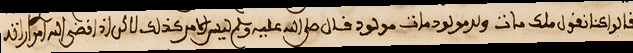قالوا كنا نقول ملك مات ولد مولود مات مولود قال صلى الله عليه وسلم ليس الامر كذلك لاكن اذا قضى الله امرا راته
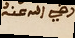رضي الله عنه
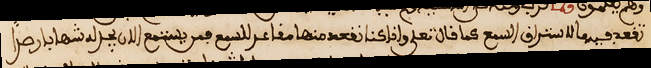تقعد فيهما لاستراق السمع كما قال تعلى وانا كنا نقعد منها مقاعد للسمع فمن يستمع الان يجد له شهابا رصدا
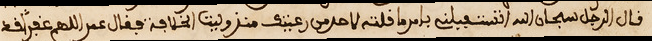قال الرجل سبحان الله اتستقبلنى بامر ما قلته لاحد من رعيتك منذ وليت الخلافة فقال عمر اللهم غفرا قد
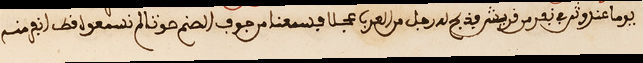يوما عند وثمن في نفر من قريش فذبح له رجل من العرب عجلا فسمعنا من جوف الصنم صوتا لم نسمعوا قط انفد منه
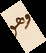وهو
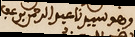وهو سيدنا عبد الرحمن بن عوف
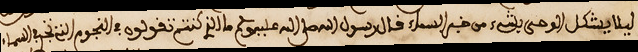ليلا يشكل الوحى بشىء من خبر السماء قال رسول الله صلى الله عليه وسلم ما الذي كنتم تقولون في النجوم التي تجرى في السماء
